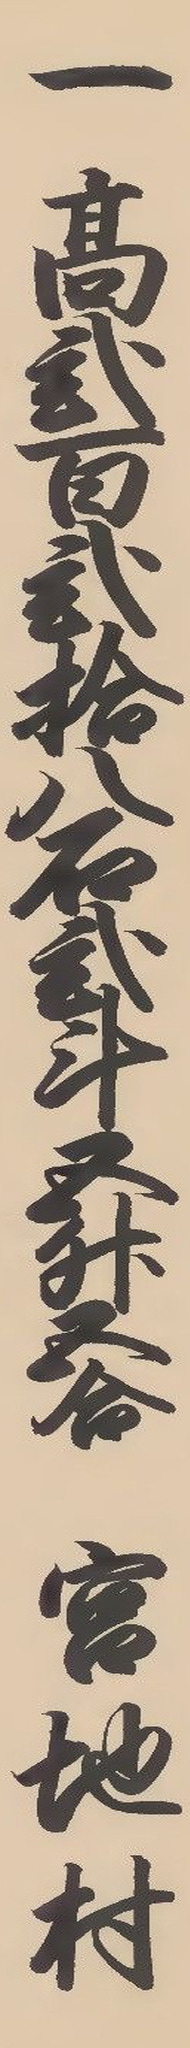一高弐百弐拾八石弐斗五升五合宮地村
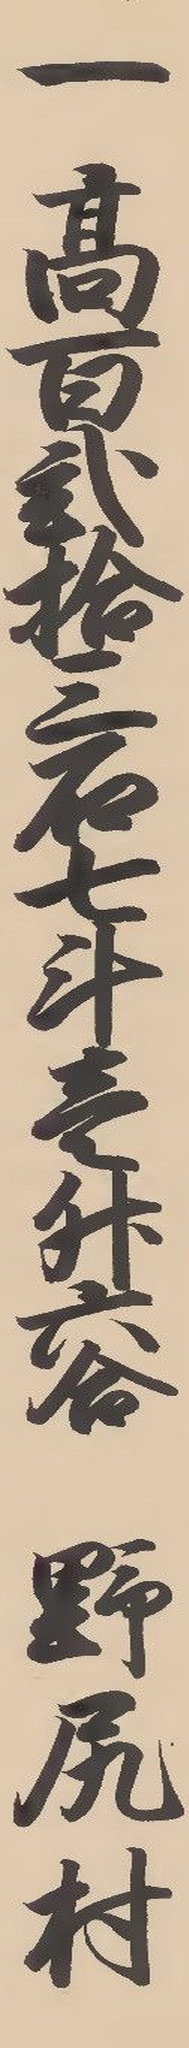一高百弐拾三石七斗壱升六合野尻村
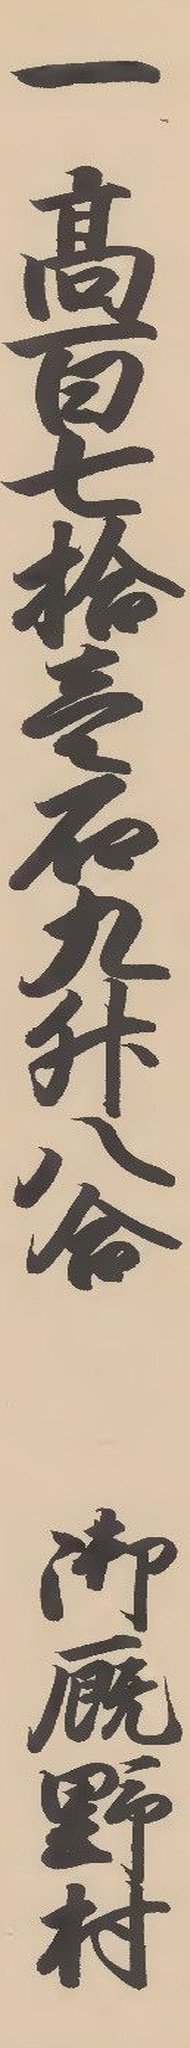一高百七拾壱石九升八合御厩野村
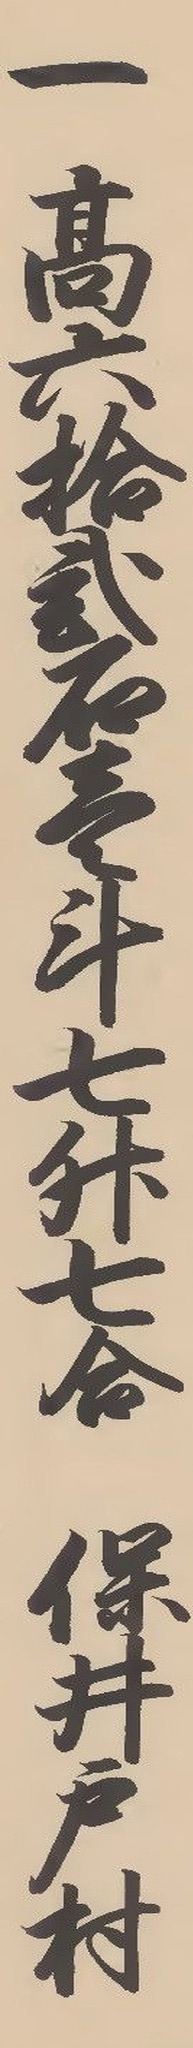一高六拾弐石壱斗七升七合保井戸村
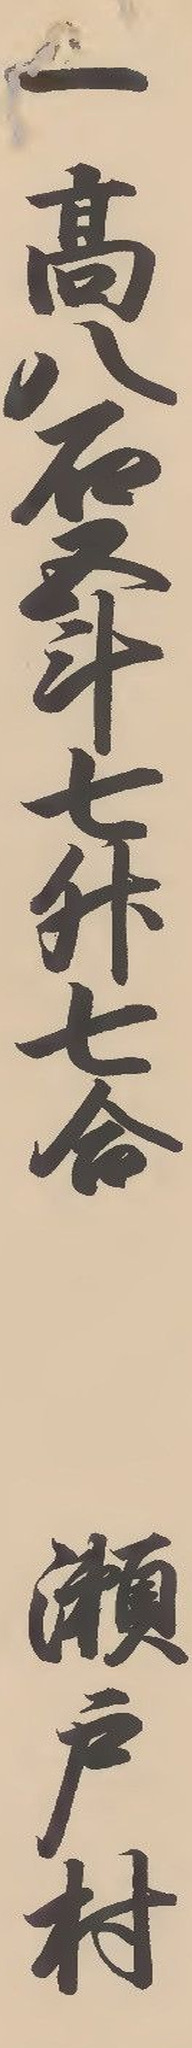一高八石五斗七升七合瀬戸村

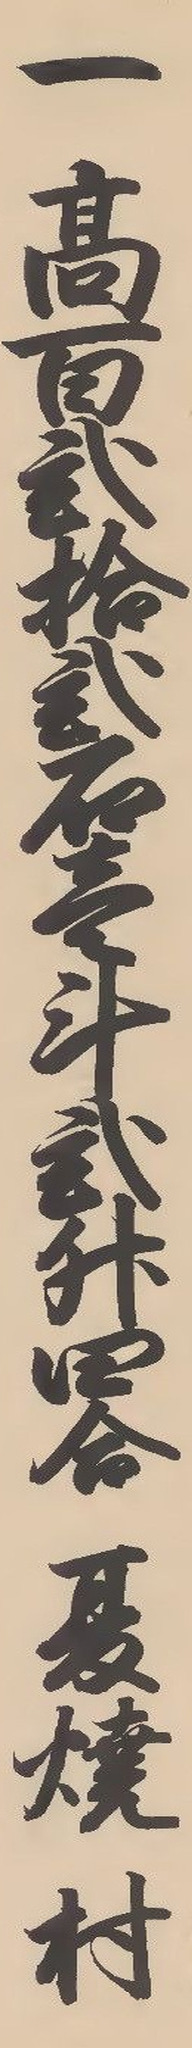一高百弐拾弐石壱斗弐升四合夏焼村
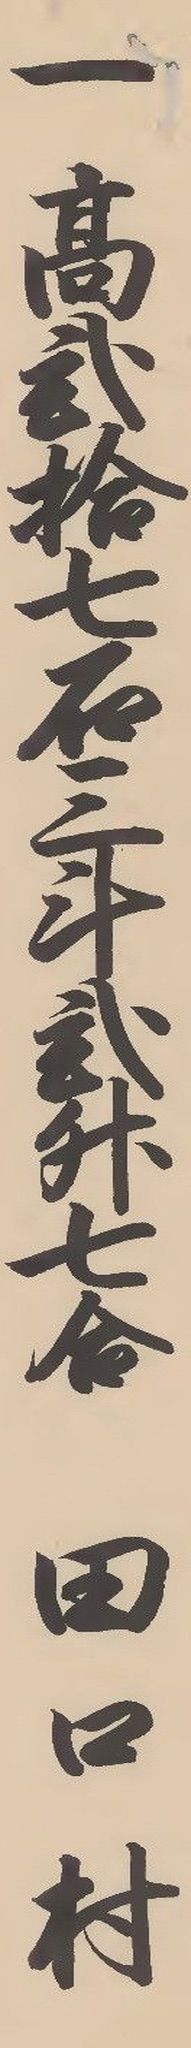一高弐拾七石三斗弐升七合田口村
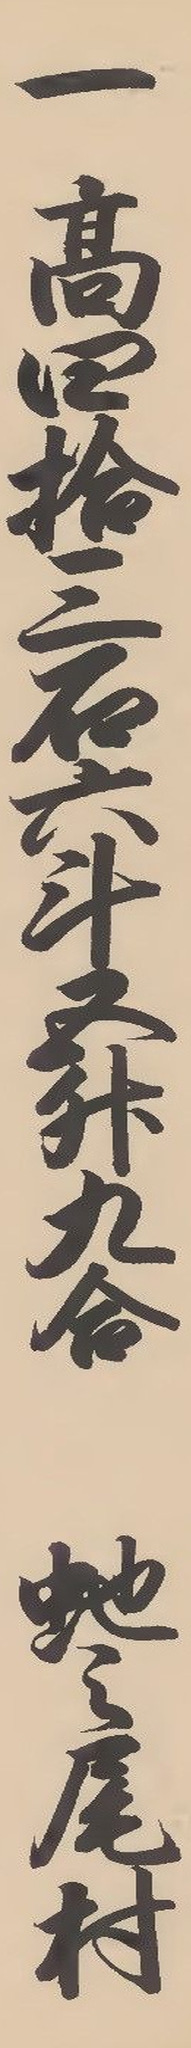一高四拾三石六斗五升九合蛇之尾村
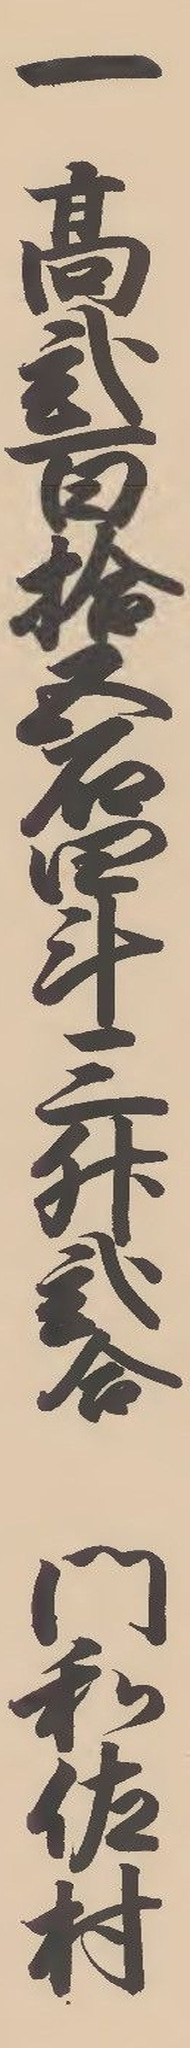一高弐百拾五石四斗三升弐合門和佐村
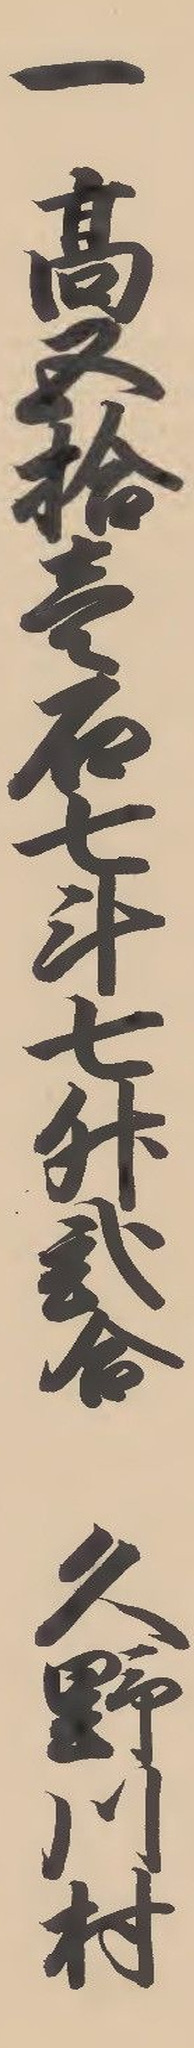一高五拾壱石七斗七升弐合久野川村
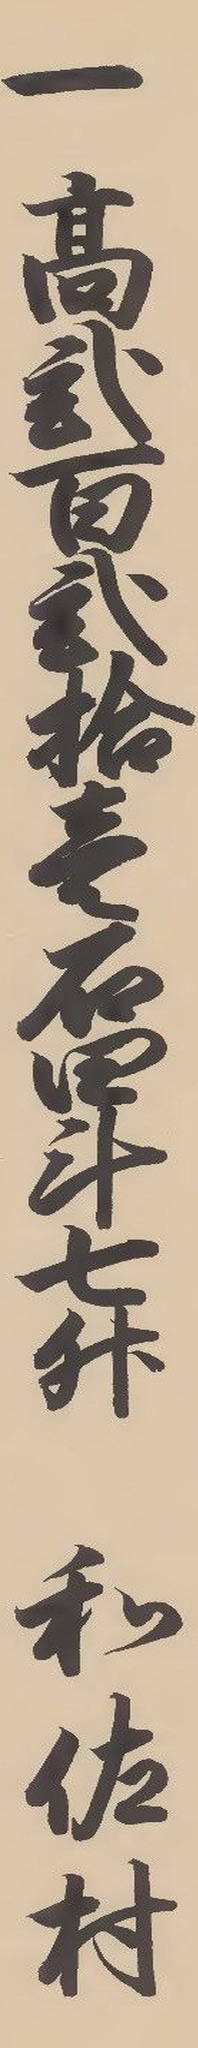一高弐百弐拾壱石四斗七升和佐村
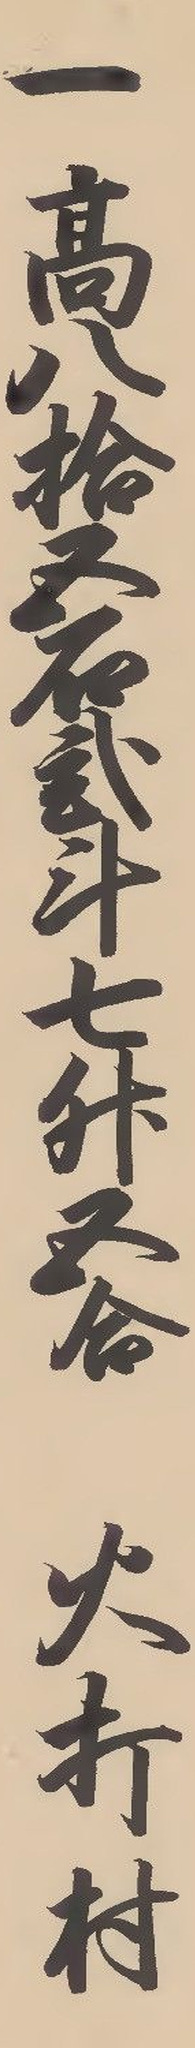一高八拾五石弐斗七升五合火打村
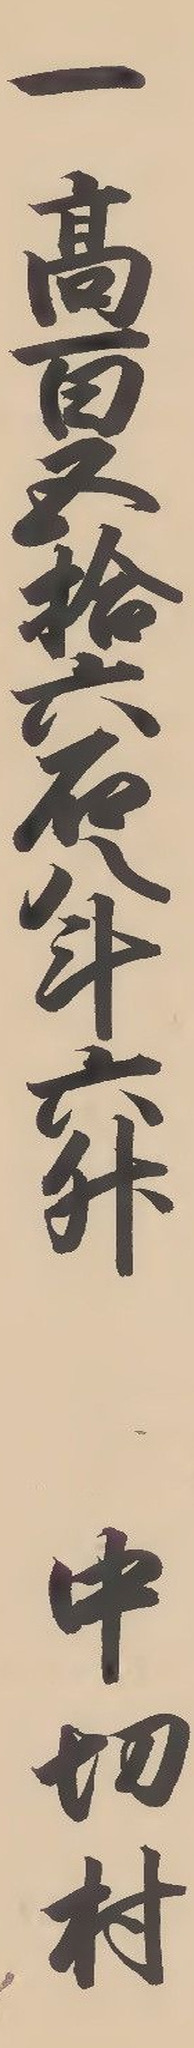一高百五拾六石八斗六升中切村

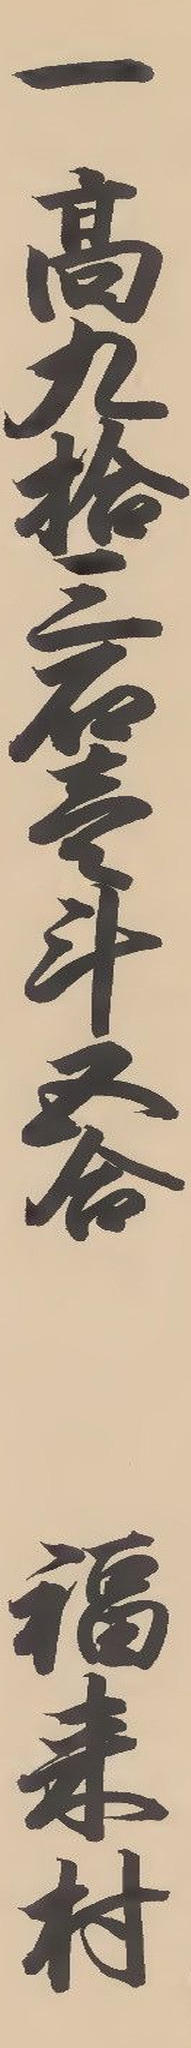一高九拾三石壱斗五合福来村
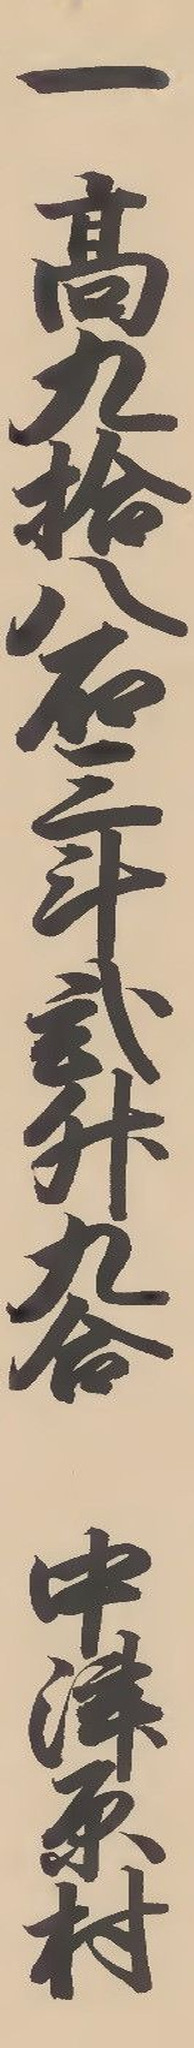一高九拾八石三斗弐升九合中津原村
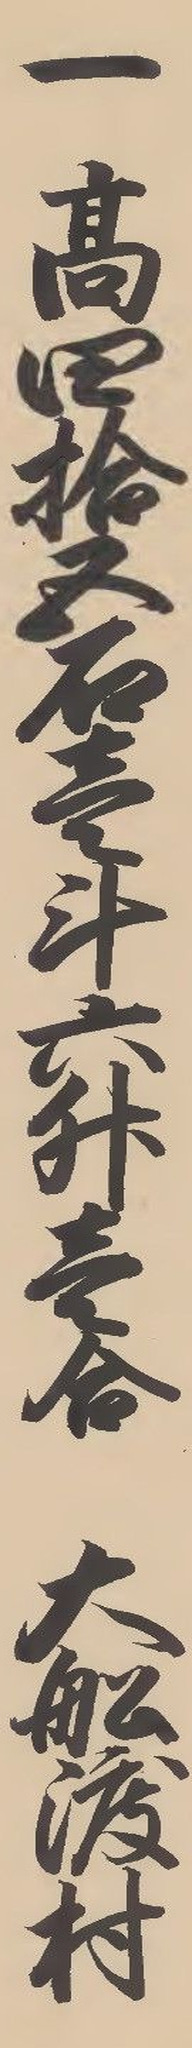一高四拾五石壱斗六升壱合大船渡村
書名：飛騨国郷帳
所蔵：国立公文書館 National Archives of Japan
